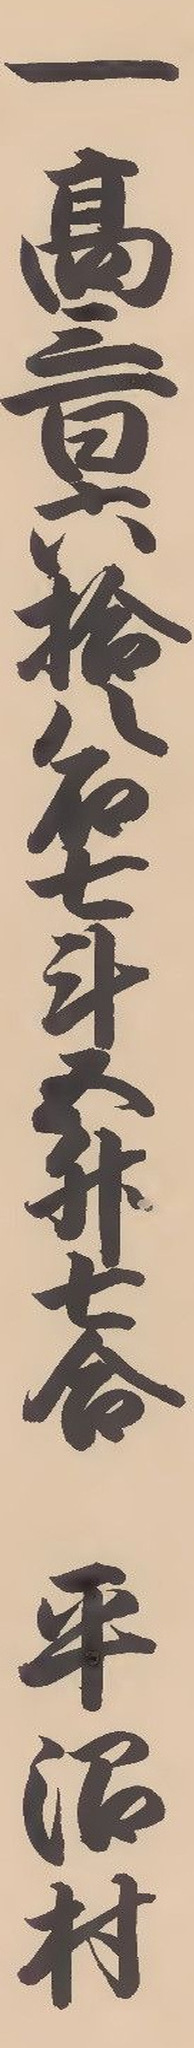一高三百六拾八石七斗五升七合平沼村
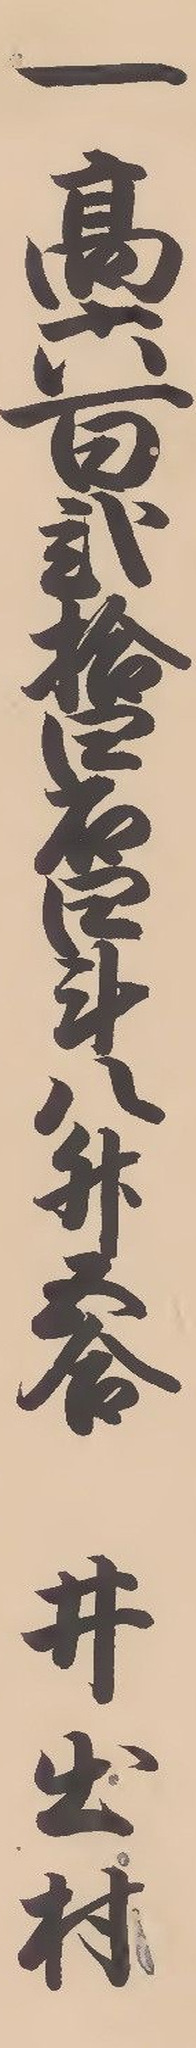一高六百弐拾四石四斗八升五合井出村
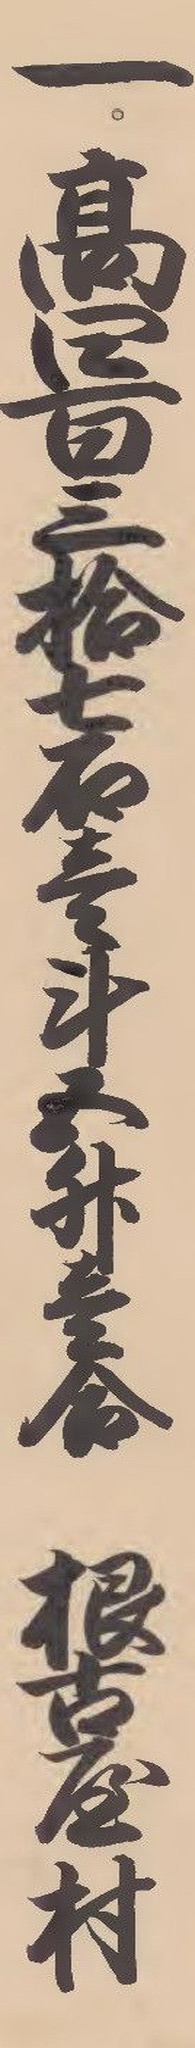一高四百三拾七石壱斗五升壱合根古屋村
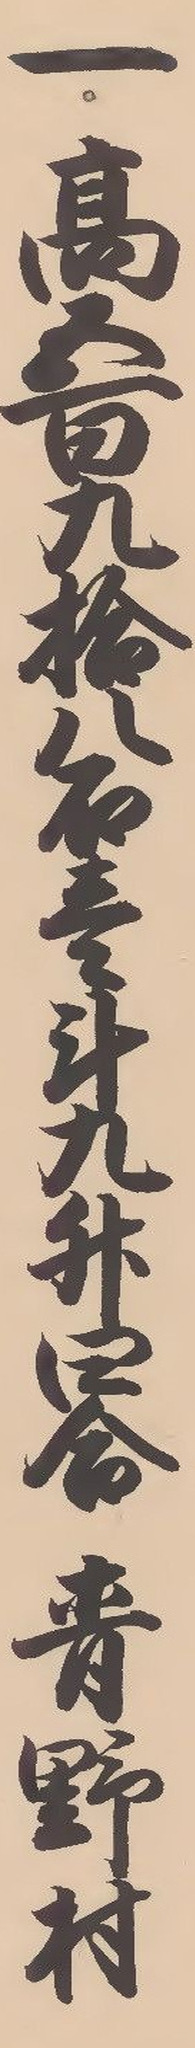一高五百九拾八石壱斗九升四合青野村
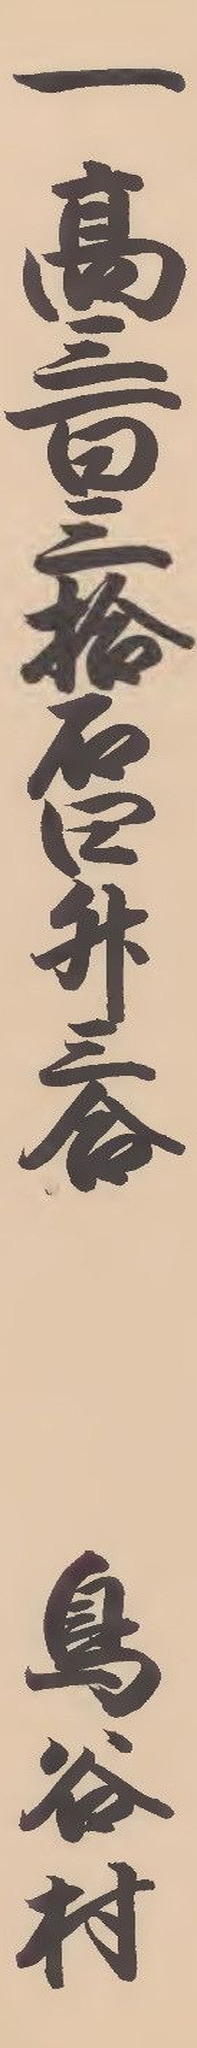一高三百三拾石四升三合鳥谷村
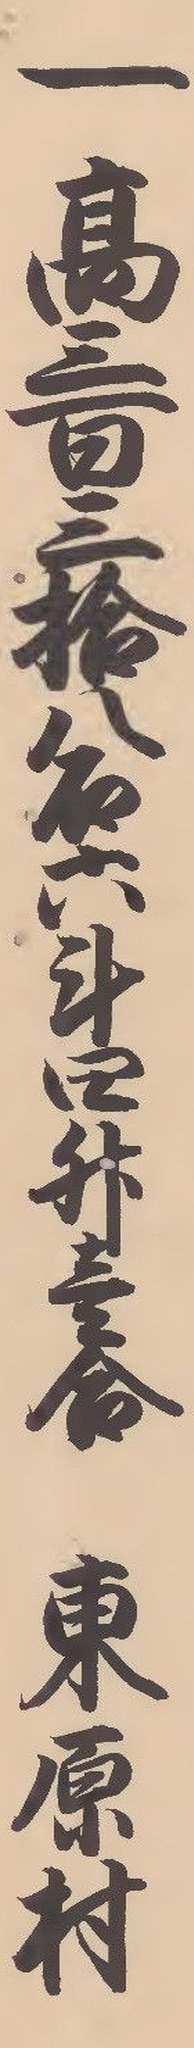一高三百三拾八石六斗四升壱合東原村

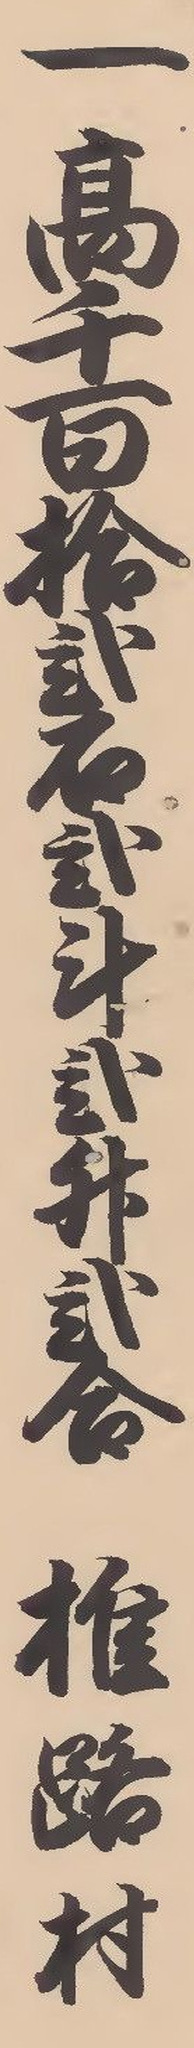一高千百拾弐石弐斗弐升弐合椎路村
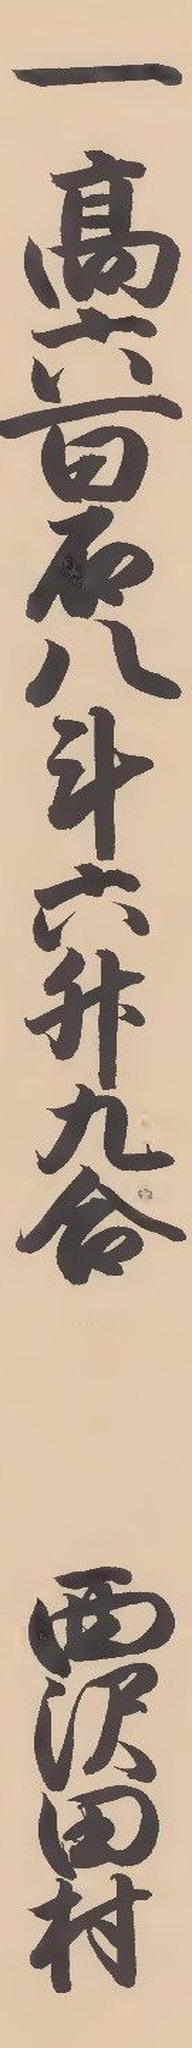一高六百石八斗六升九合西沢田村
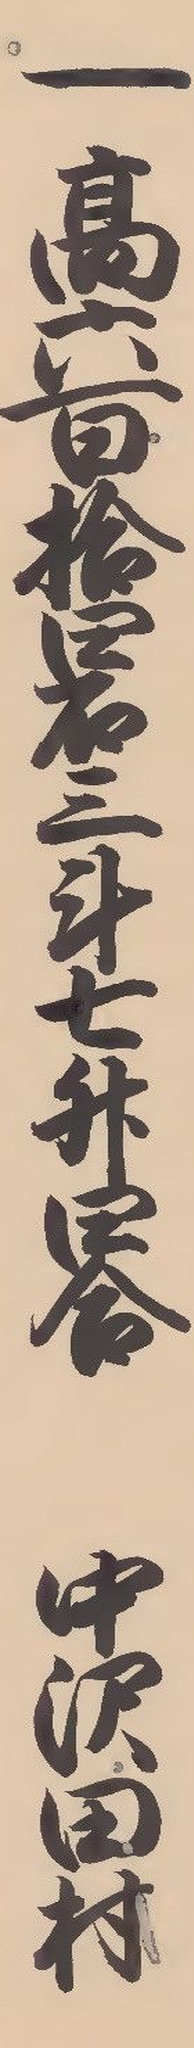一高六百拾四石三斗七升四合中沢田村
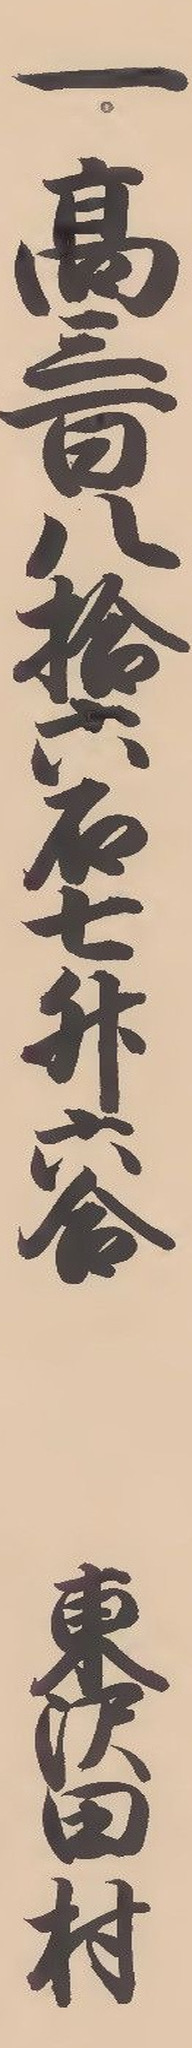一高三百八拾六石七升六合東沢田村
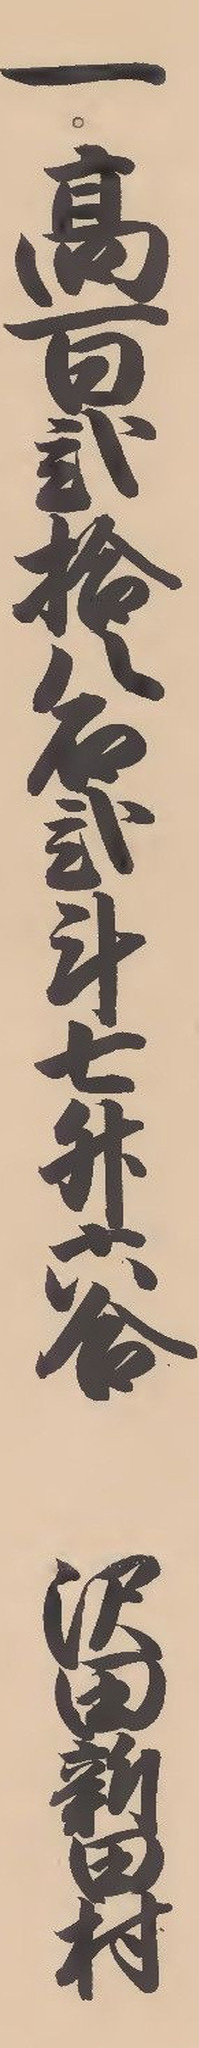一高百弐拾八石弐斗七升六合沢田新田村
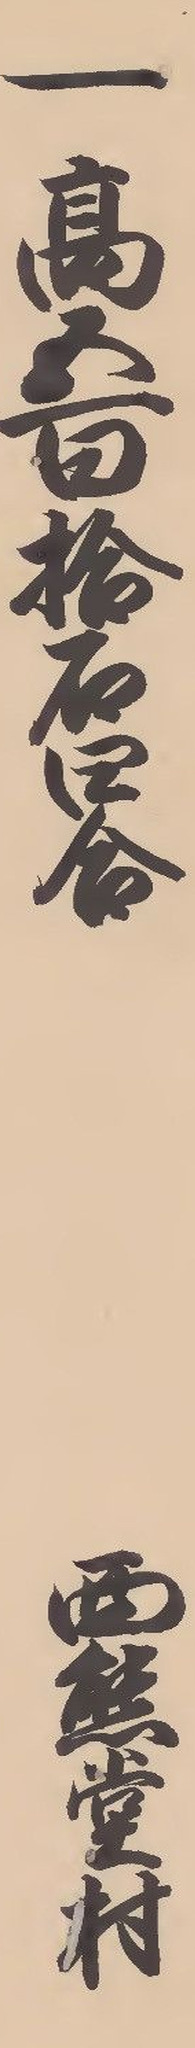一高五百拾石四合西熊堂村
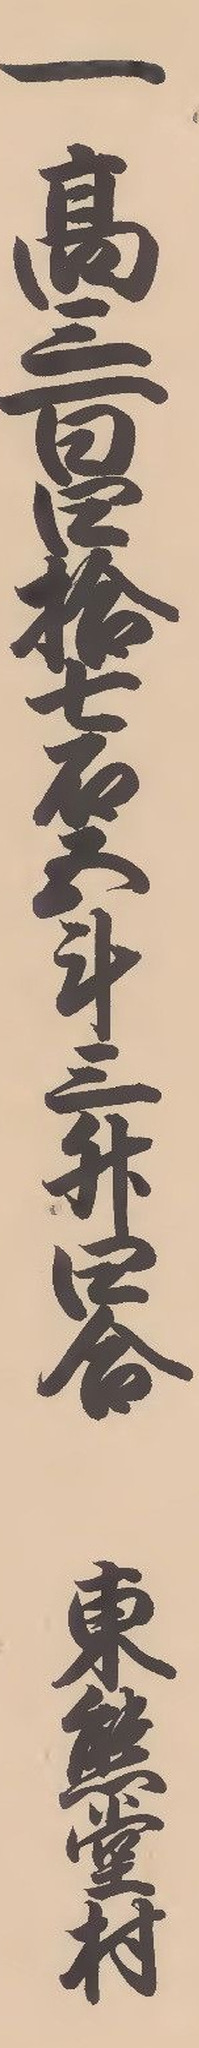一高三百四拾七石五斗三升四合東熊堂村
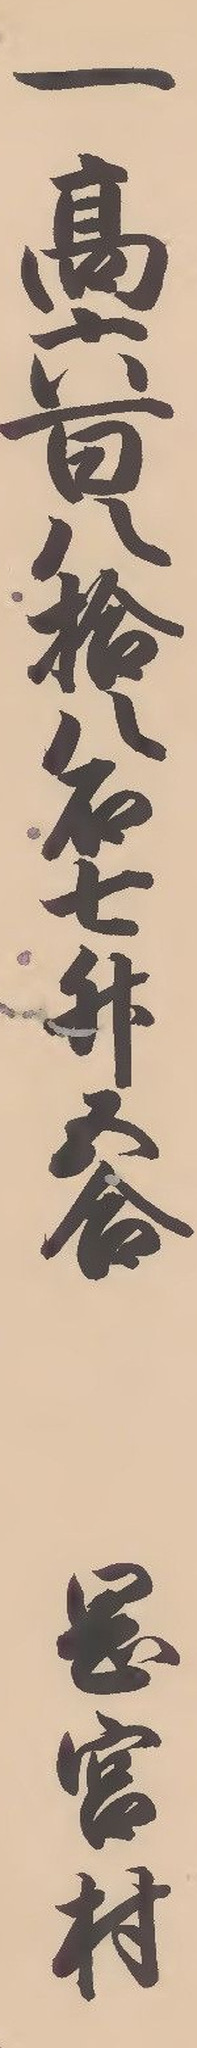一高六百八拾八石七升五合岡宮村

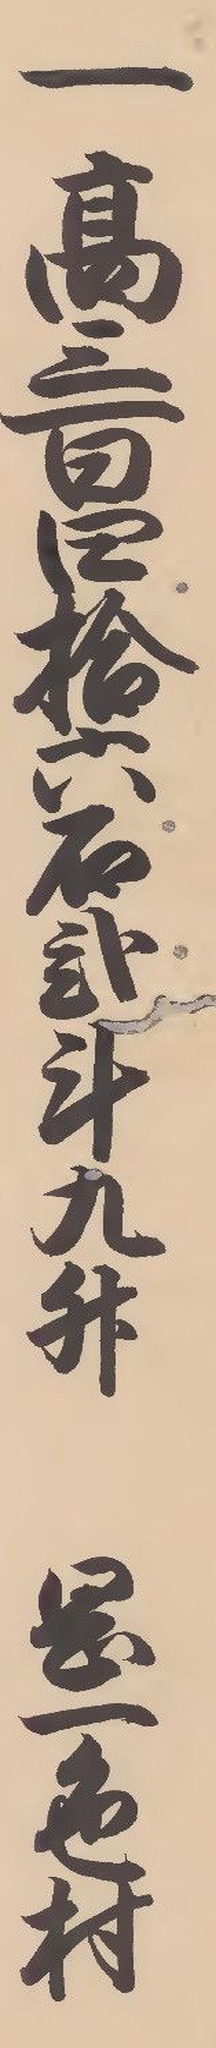一高三百四拾六石弐斗九升岡一色村
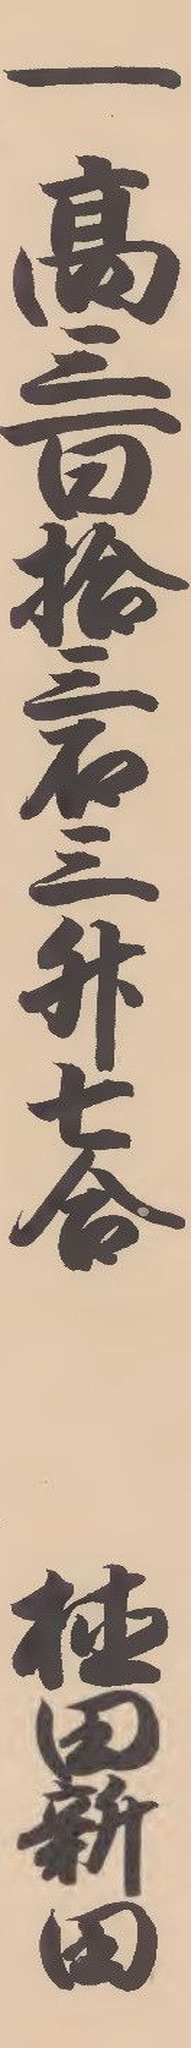一高三百拾三石三升七合植田新田
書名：駿河国郷帳
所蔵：国立公文書館 National Archives of Japan
